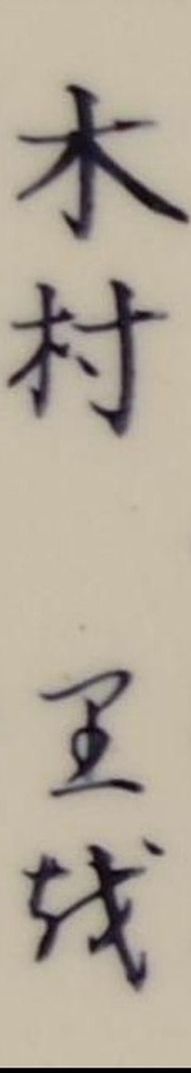木村りを
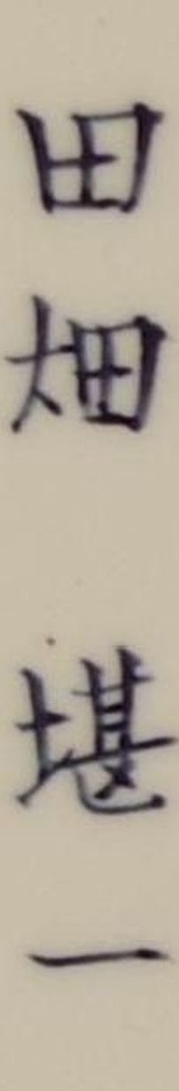田畑堪一
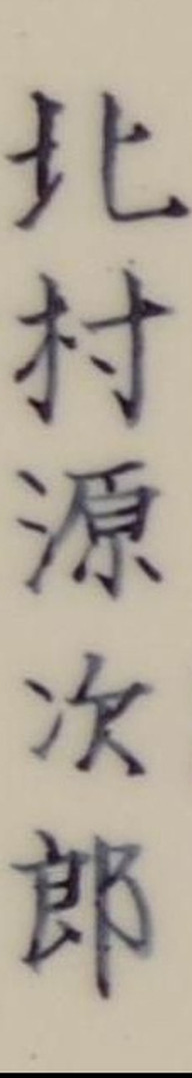北村源次郎
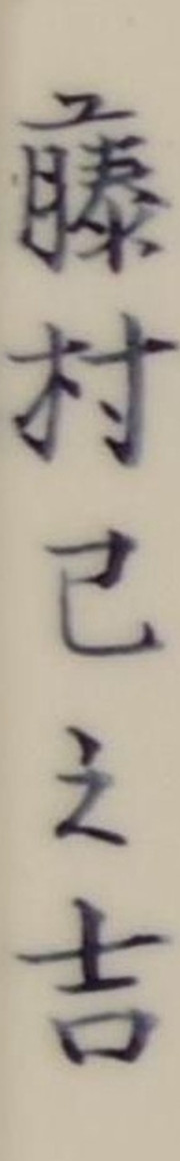藤村己之吉

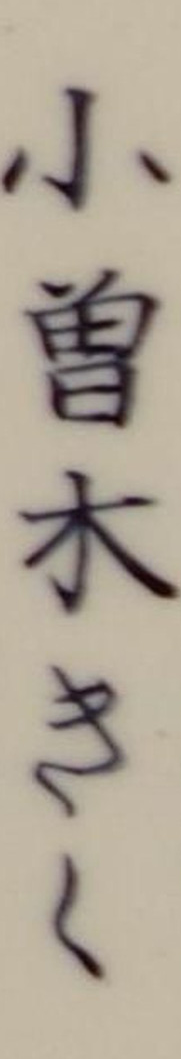小曽木きく
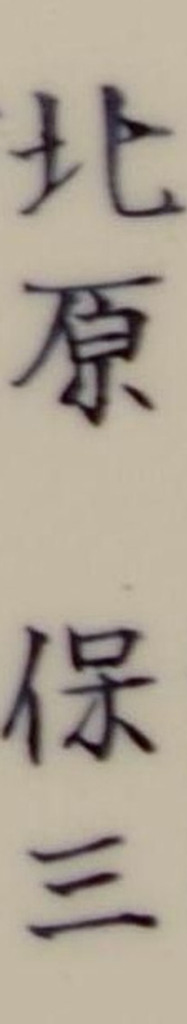北原保三
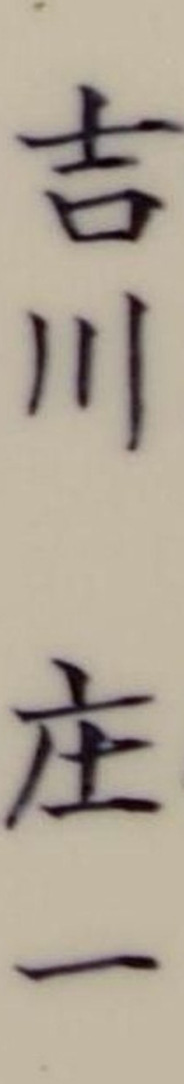吉川庄一
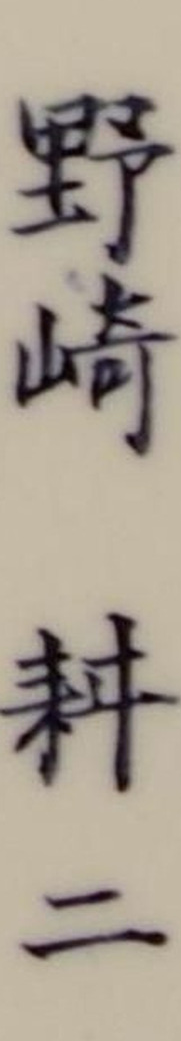野崎耕二
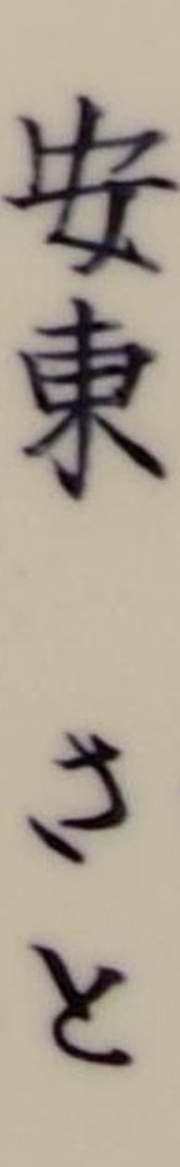安東さと
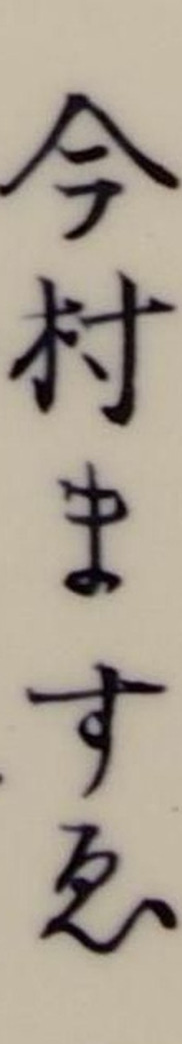今村ますゑ
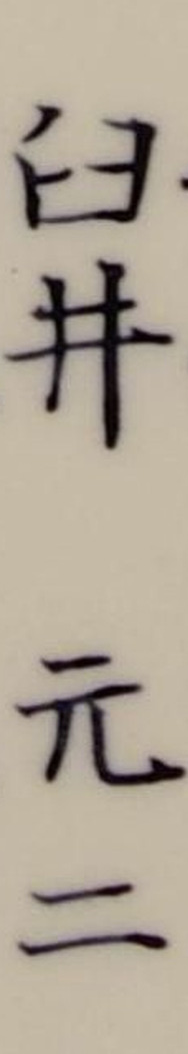臼井元二
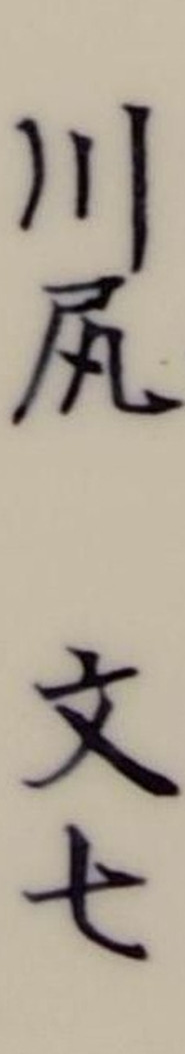川尻文七
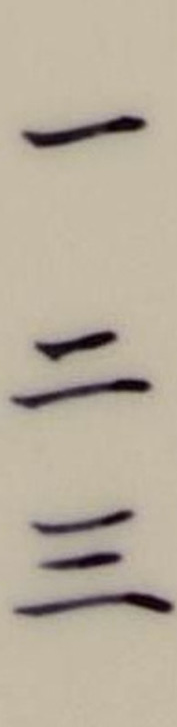一二三
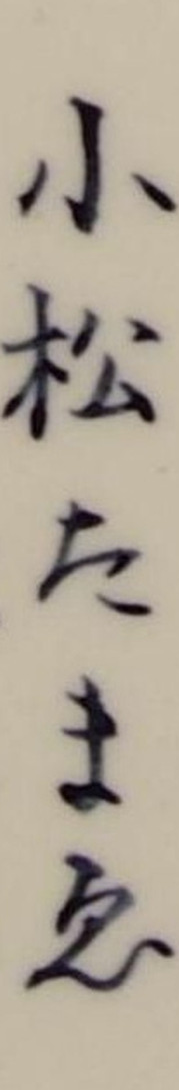小松たまゑ
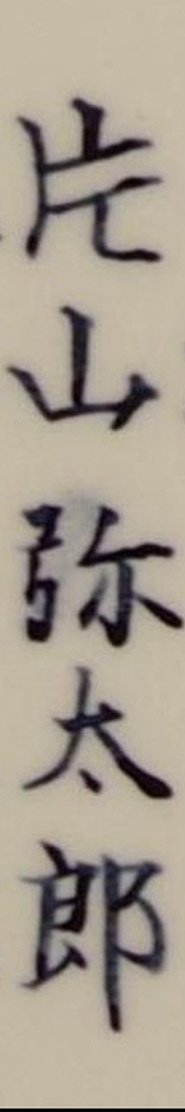片山弥太郎
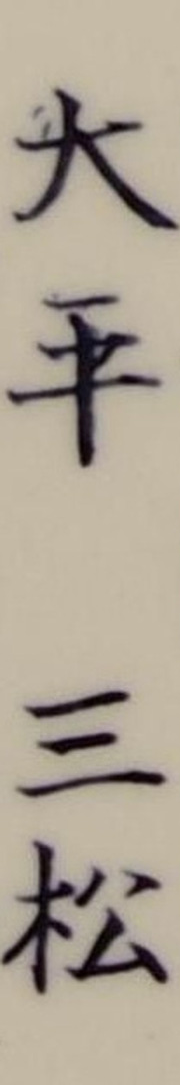大平三松
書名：M~S
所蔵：高野山金剛峯寺
